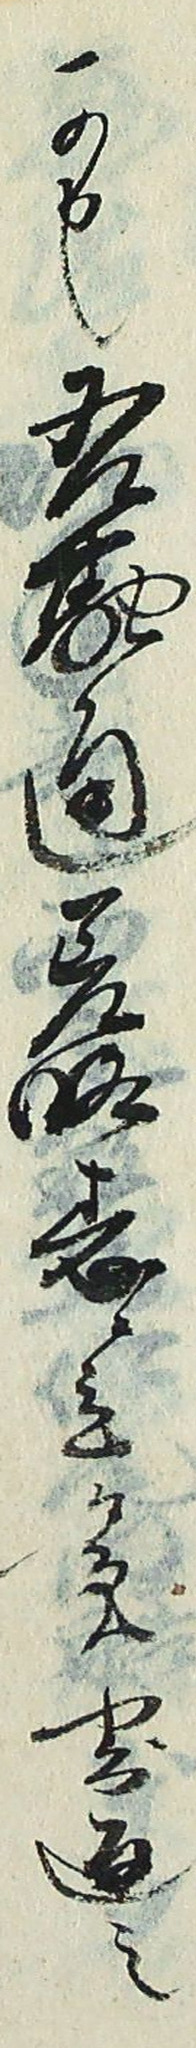可申右融通差略表ニ立候而ハ歩返之
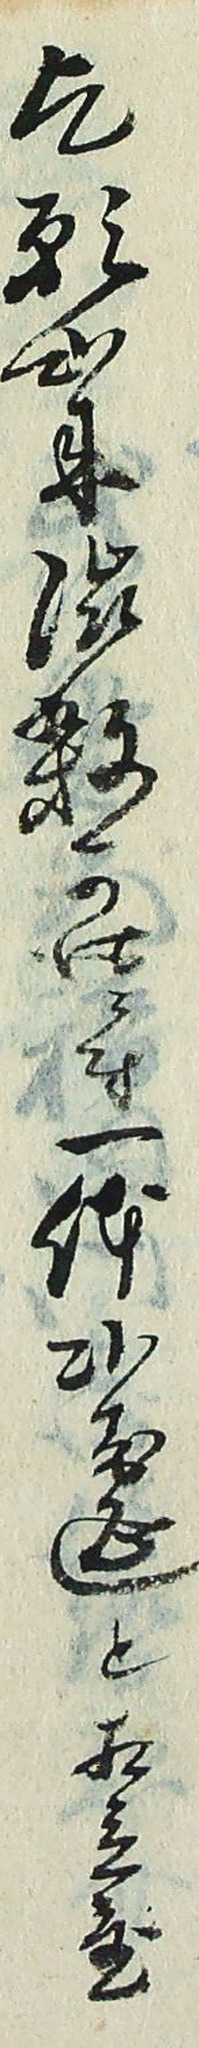乞願出来渋殺可仕ニ付一体弐歩延と相立置
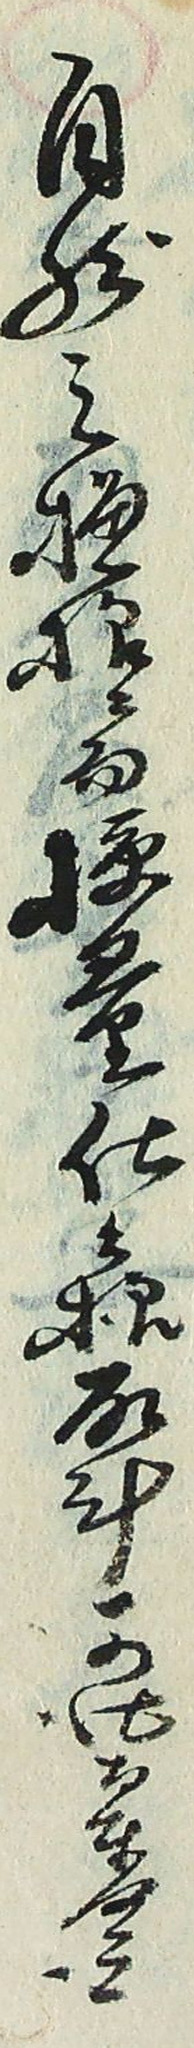自然之模様ニ而授量仕候様取計可仕と奉存候以上
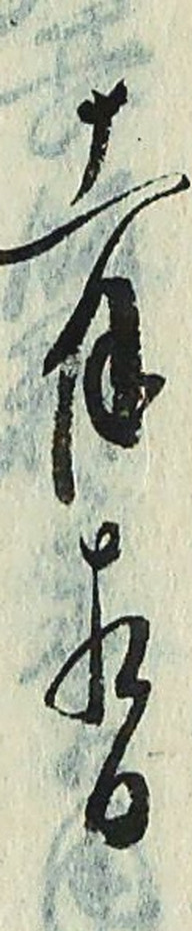十一月十九日
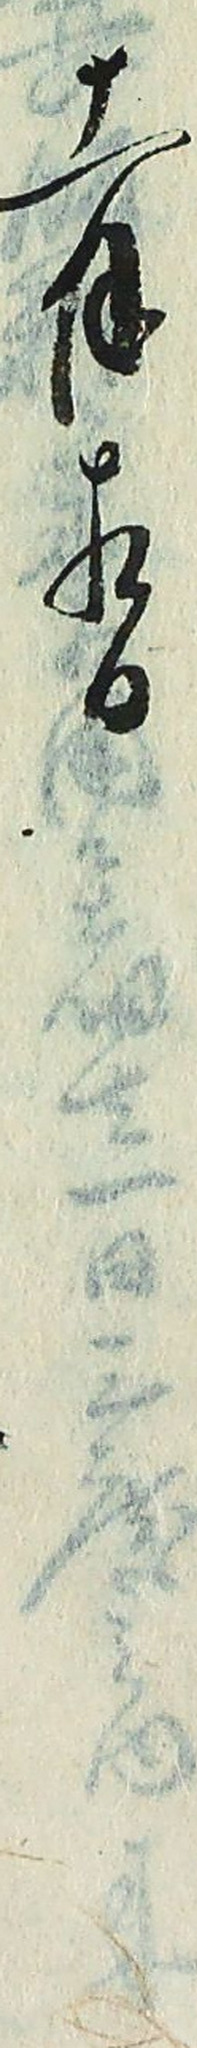十一月十九日
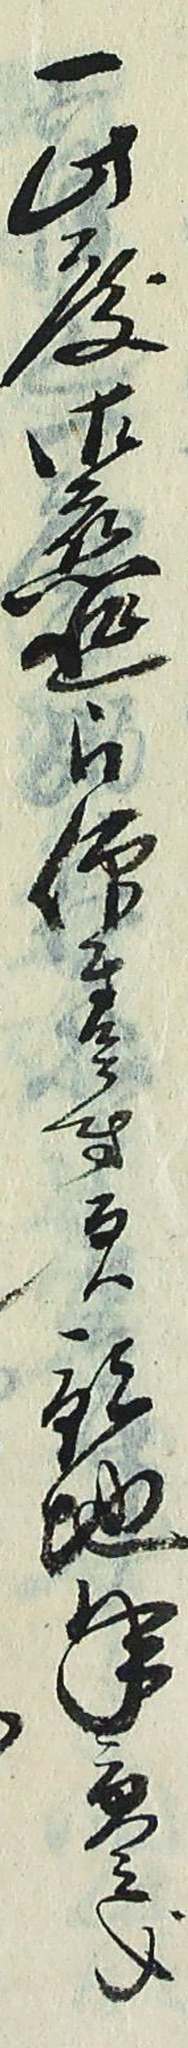一此度御慈悲被仰付ニ付而ハ預地年貢之義
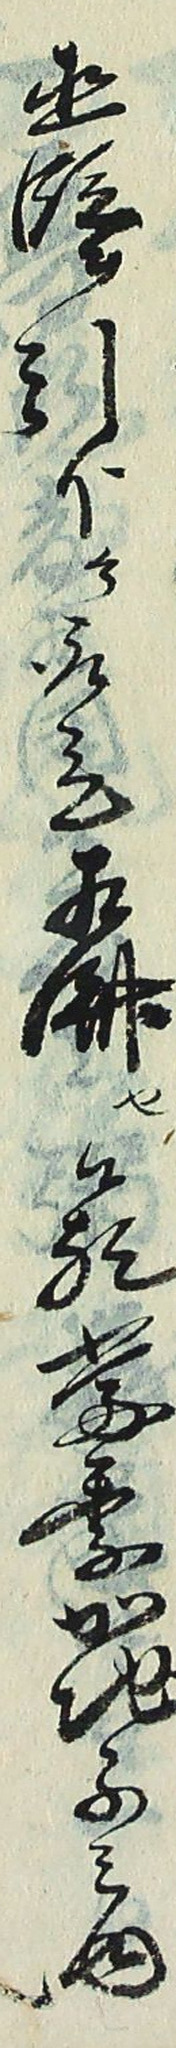直段ヲ引下ケ取立相済セ候歟當季加地子之内
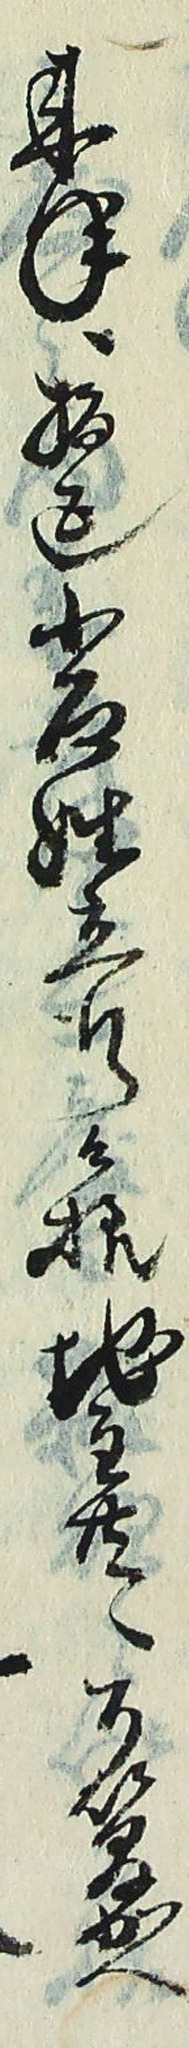来年へ指延小百姓立行候様地主共へ了簡加へ
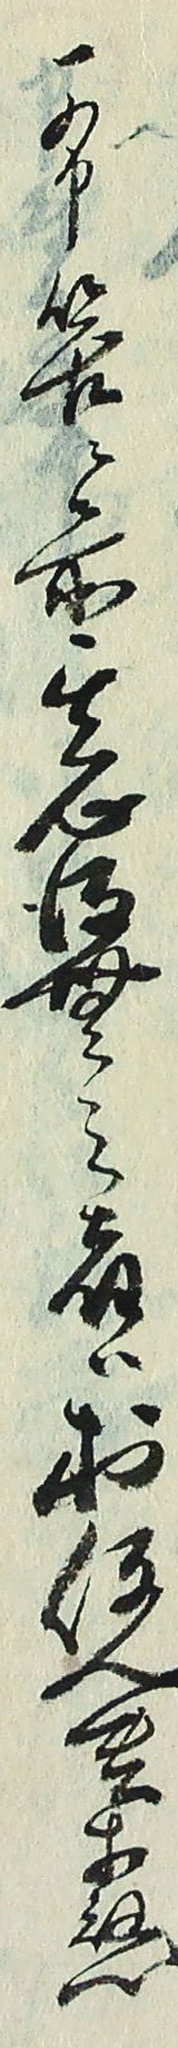可申筈ニ候所其心得無之者ハ村役人共相應
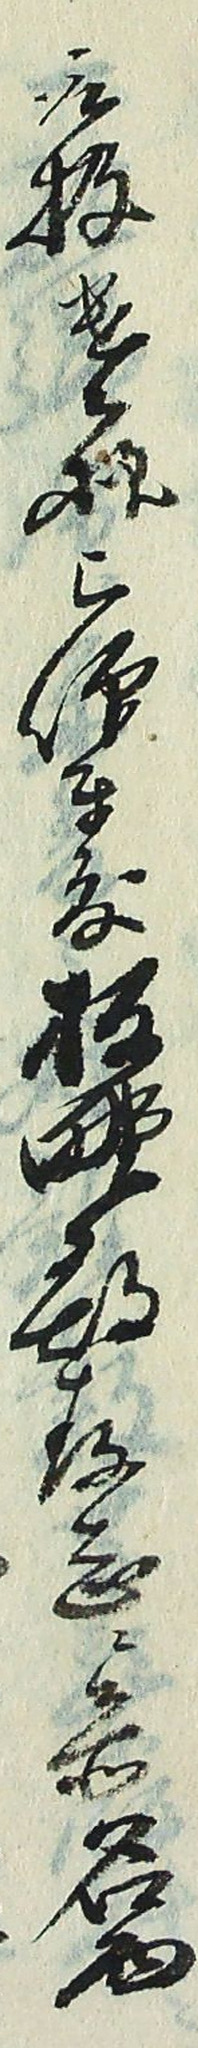取扱遣候様被仰付度板野郡存念ニ候所名西
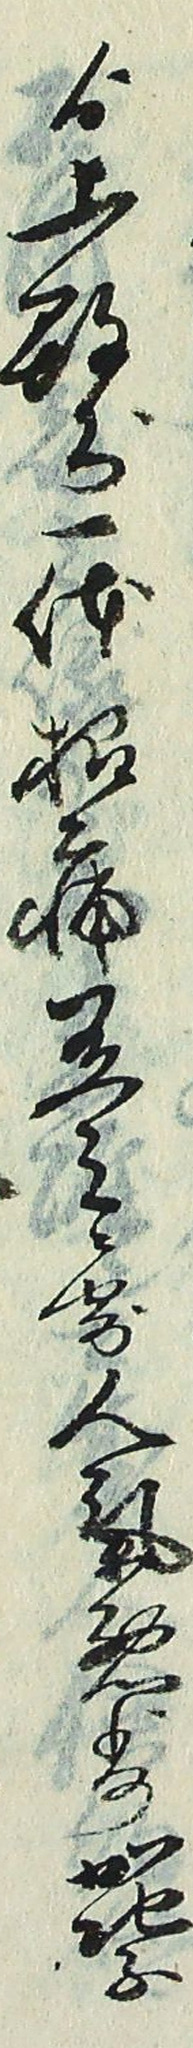ゟ上郡分一体根痛有之ニ寄人氣悪布加地子
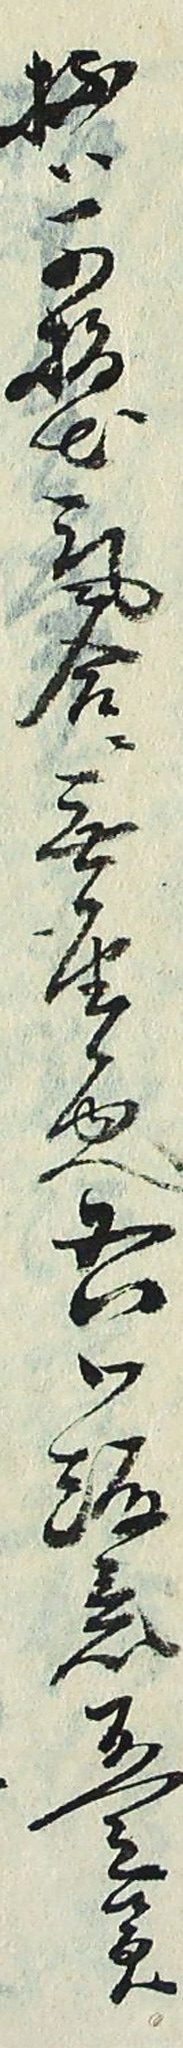抔ハ可指出気合ニ無御坐候ゆへ右御趣意有之候而ハ
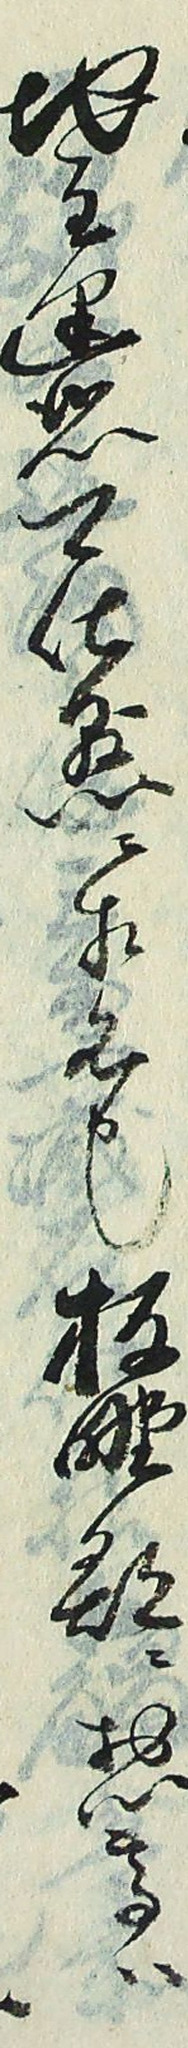地主運迷惑可仕懸ニ相見申候板野郡ニおいてハ
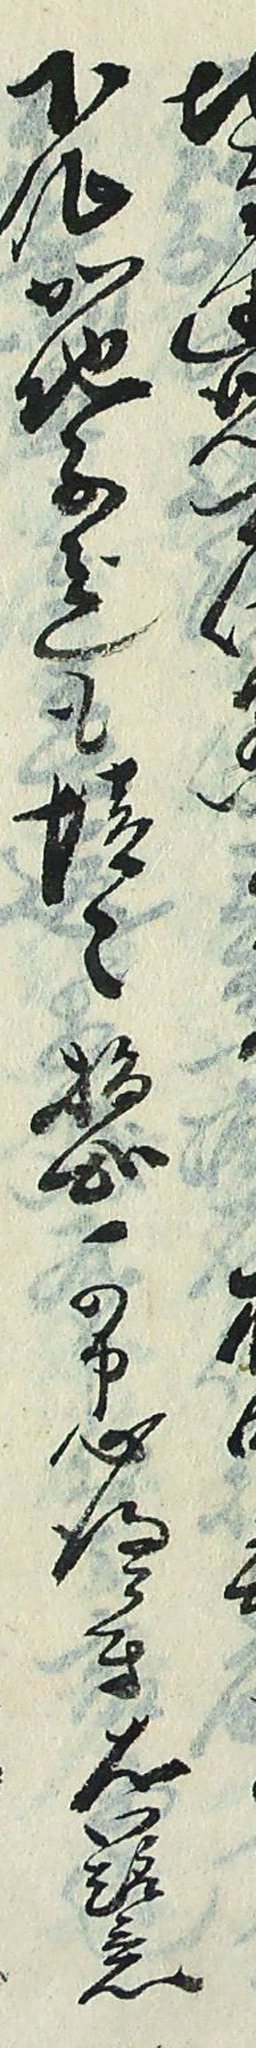下作加地子迄も精々指出可申心得ニ付右御趣意
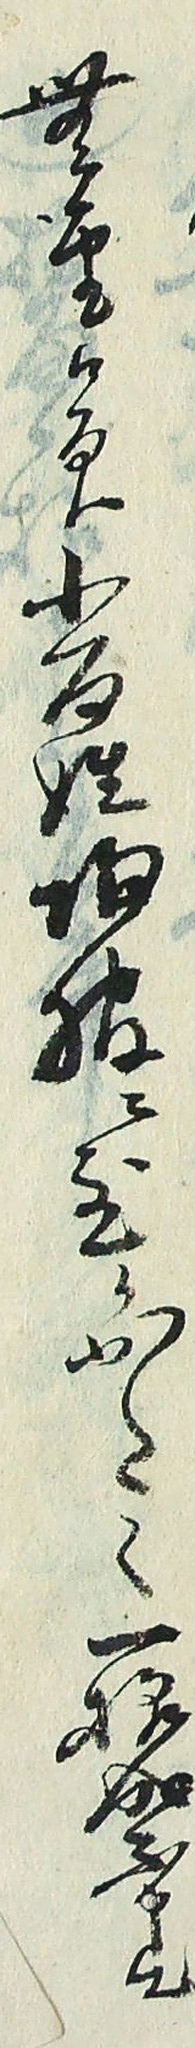無御坐候而ハ小百姓帰服ニ至りかたく一様成不申候

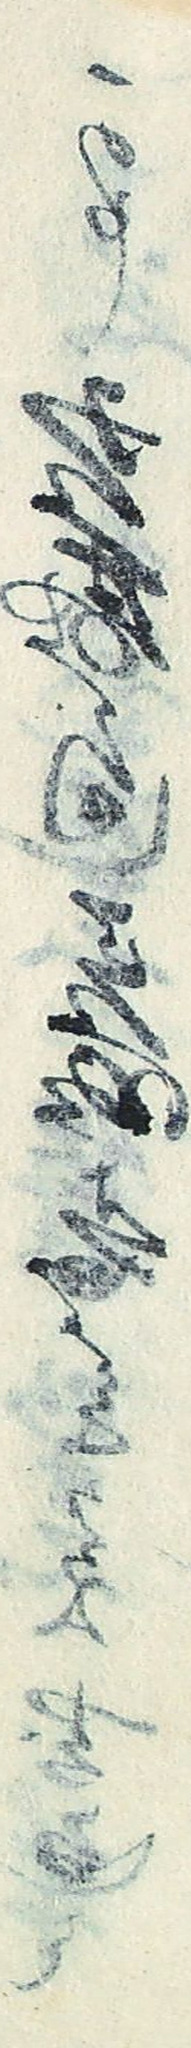十一月十九日
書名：諸御趣意書并御下知向之写
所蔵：鳴門教育大学 Naruto University of Education
